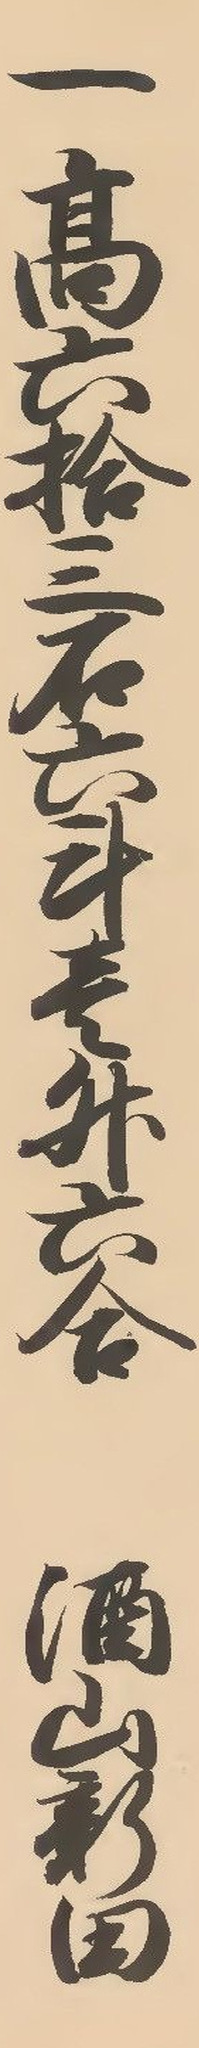一高六拾三石六斗壱升六合酒山新田
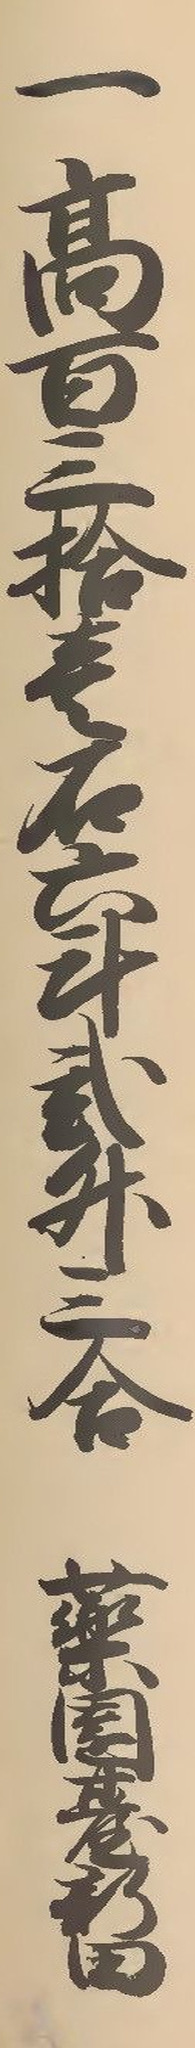一高百三拾壱石六斗弐升三合薬園台新田
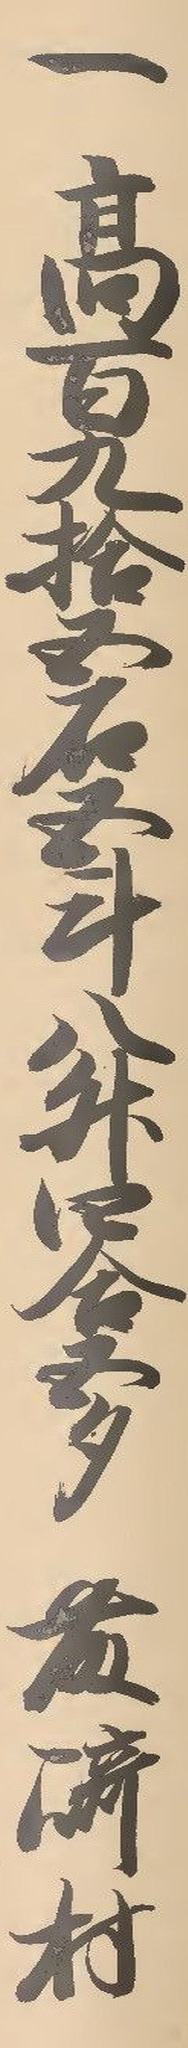一高九拾五石五斗八升四合五勺藤崎村
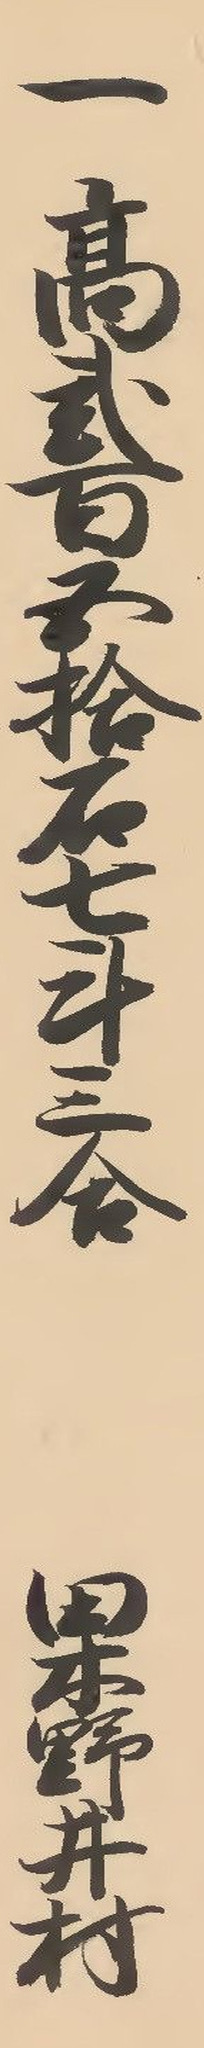一高弐百五拾石七斗三合田木野井村
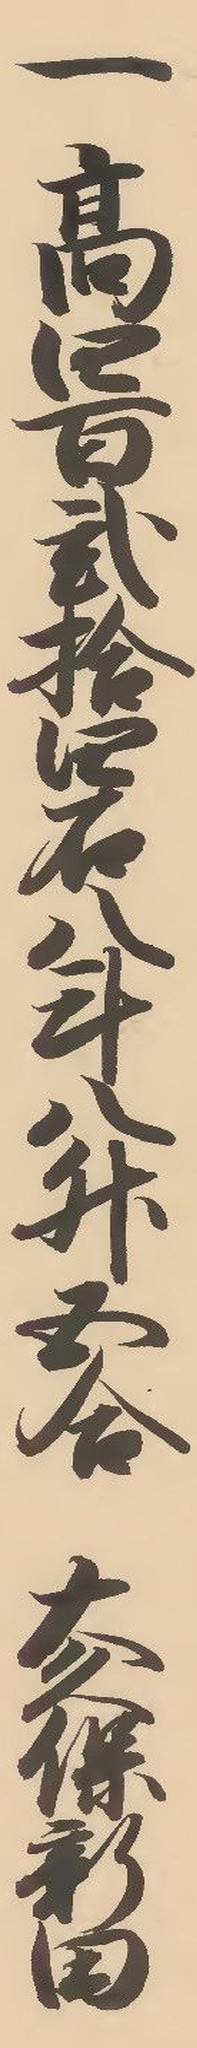一高四百弐拾四石八斗八升五合大久保新田

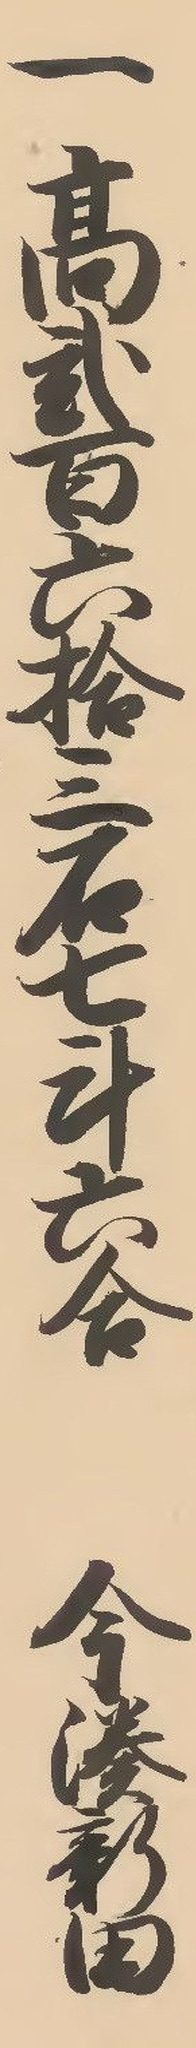一高弐百六拾三石七斗六合今湊新田
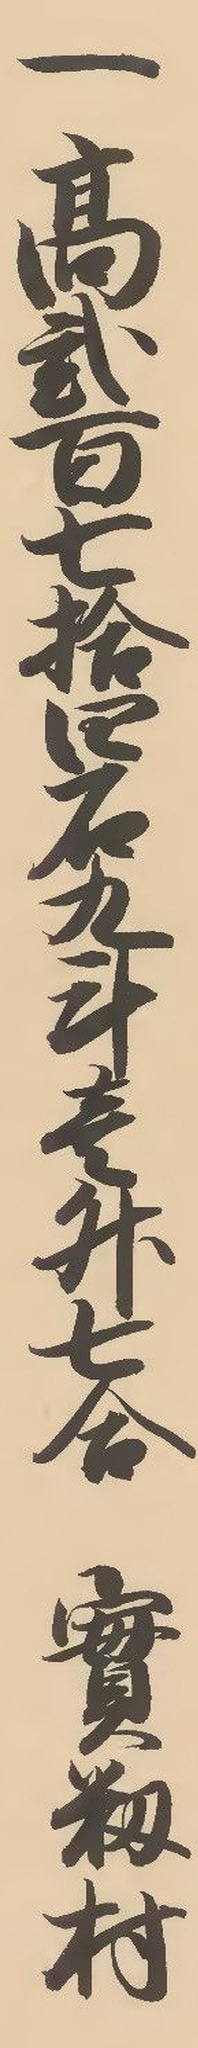一高弐百七拾四石九斗壱升七合実籾村
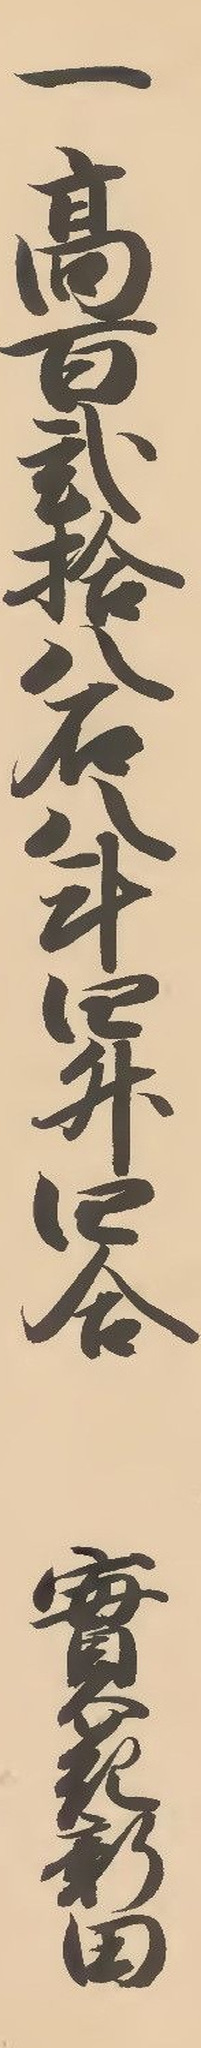一高百弐拾八石八斗四升四合実花新田
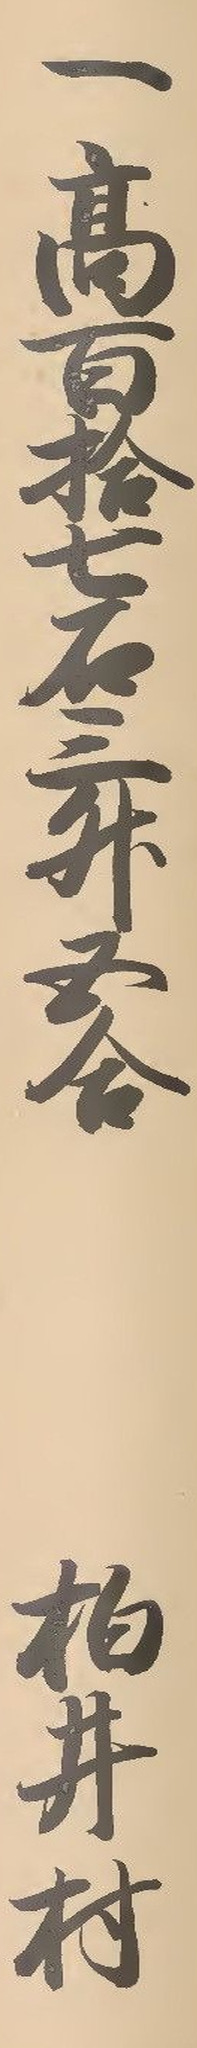一高百拾七石三升五合柏井村
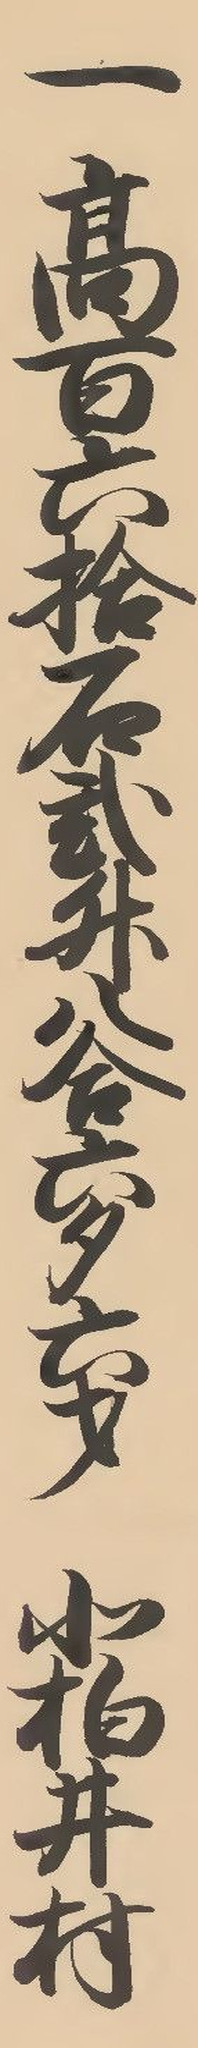一高百六拾石弐升八合六勺六才北柏井村
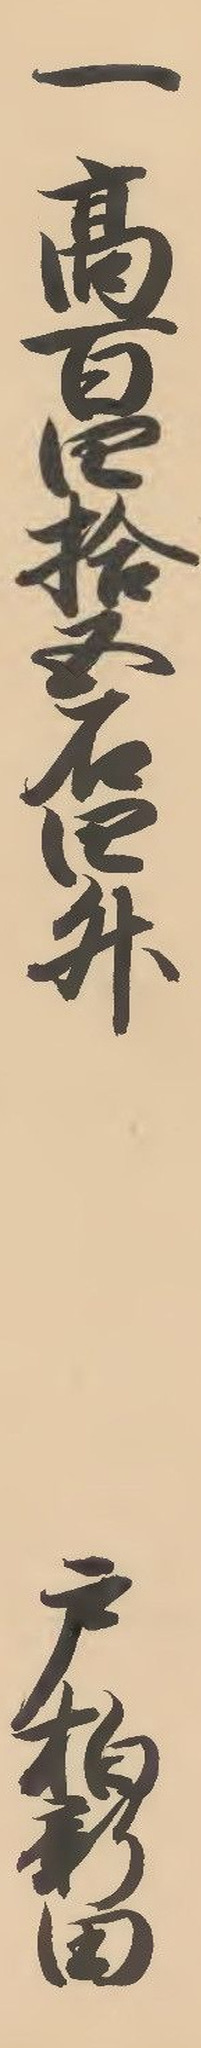一高百四拾五石四升戸柏新田
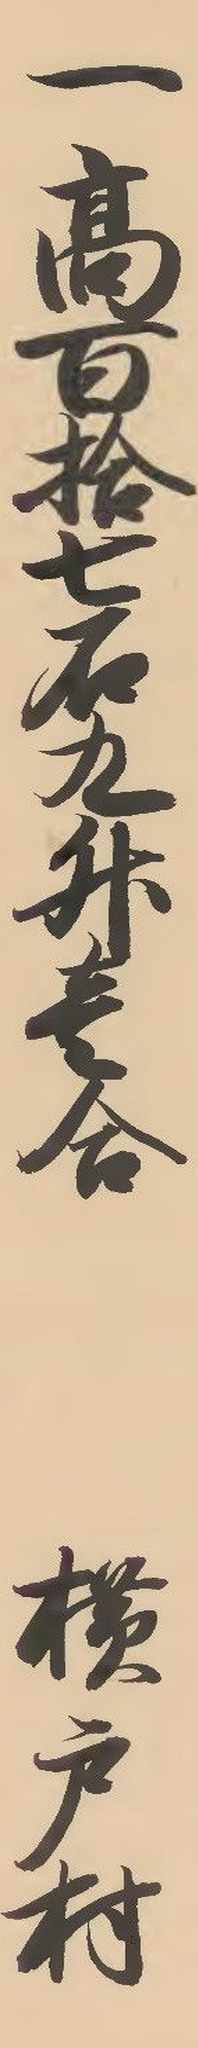一高百拾七石九升壱合横戸村

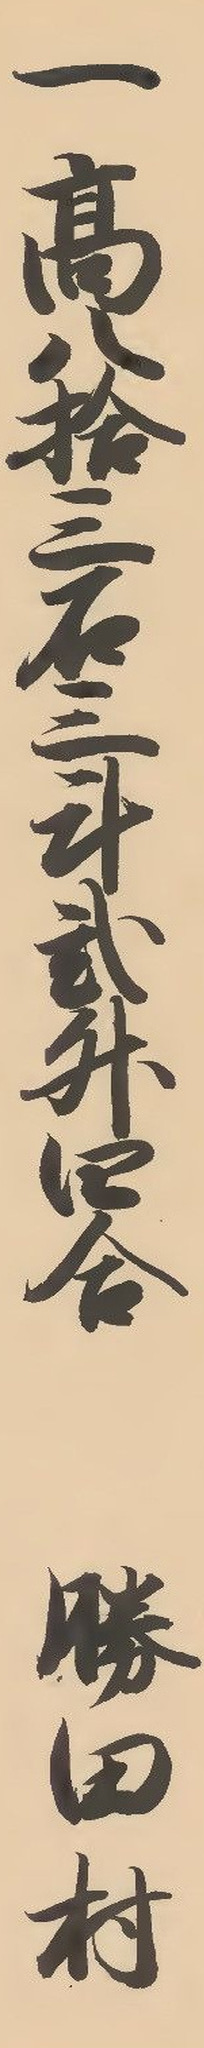一高八拾三石三斗弐升四合勝田村
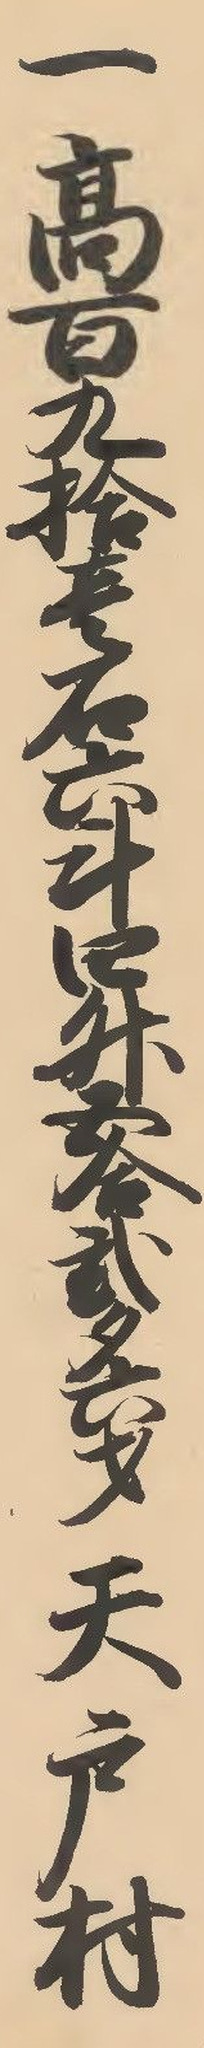一高百九拾壱石六斗四升五合弐勺六才天戸村
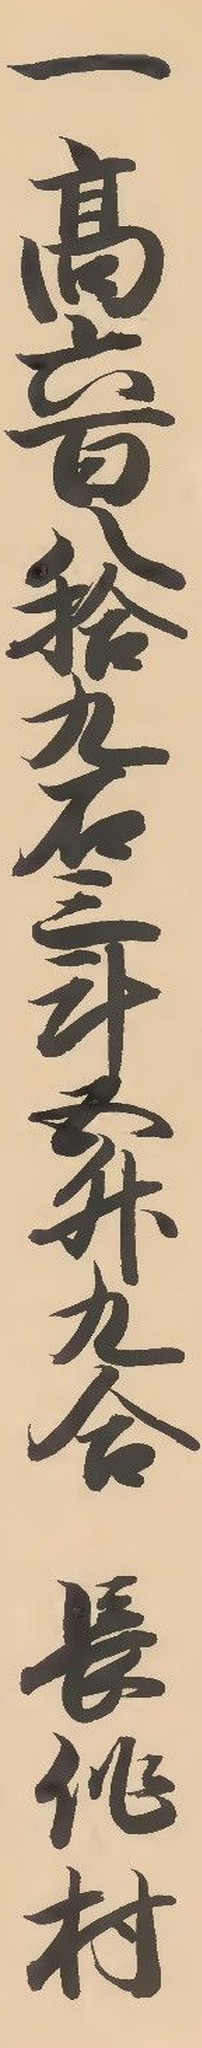一高六百八拾九石三斗五升九合長作村
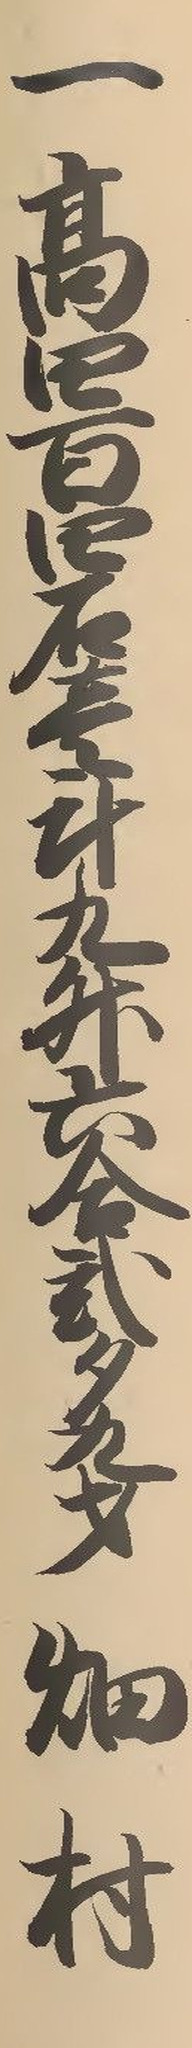一高四百四石壱斗九升六合弐勺九才畑村
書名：下総国郷帳
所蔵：国立公文書館 National Archives of Japan
